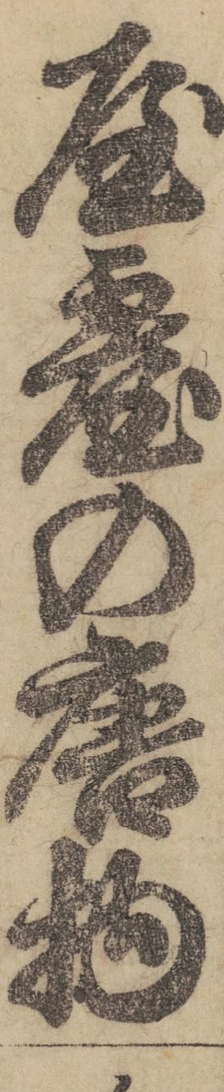屋台の唐物
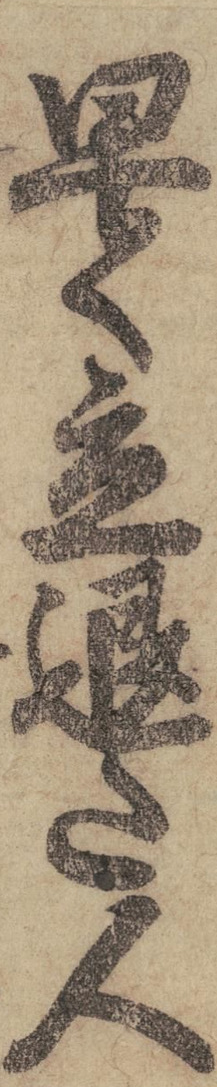早く立退た人
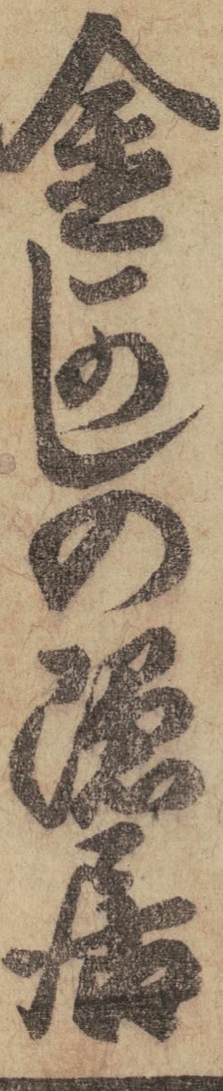金かしの隠居
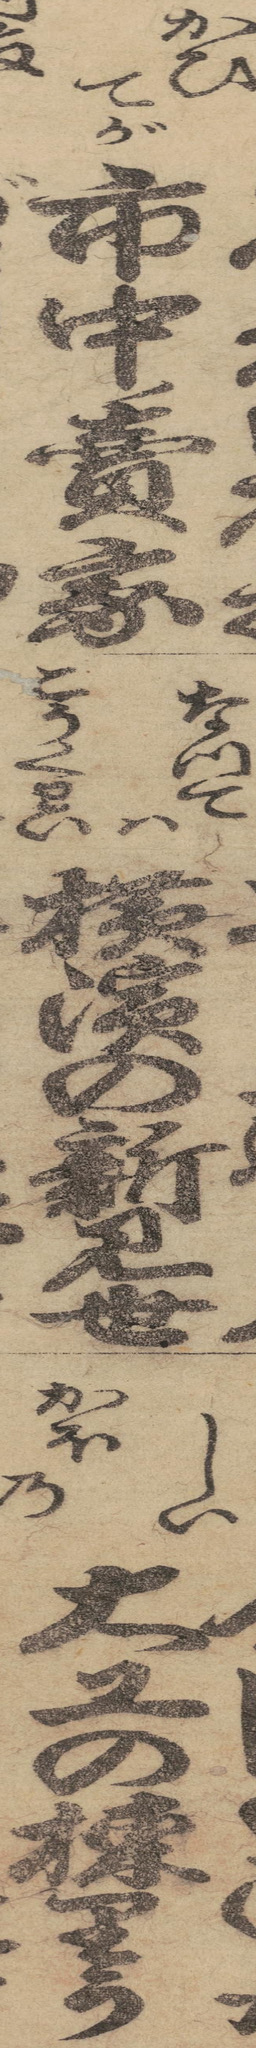市中ノ売家
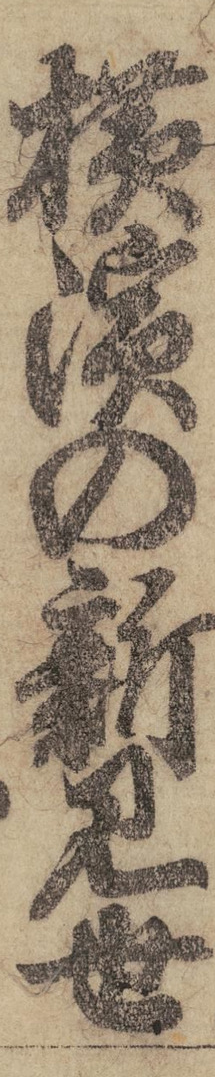横浜の新見世
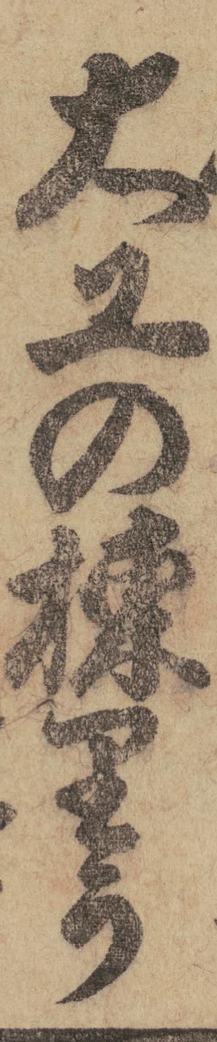大工の棟りう
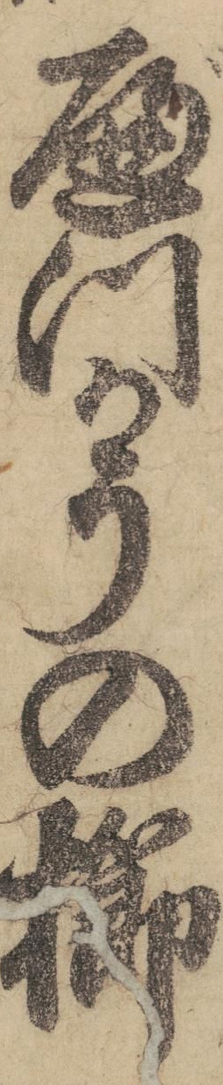べつかうの櫛
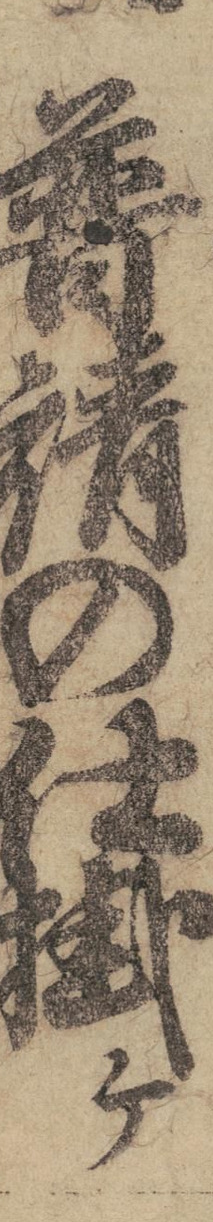普請の仕掛ケ
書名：當時見立町盡三幅對初編
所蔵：東京大学地震研究所図書室 Earthquake Research Institute Library, The University of Tokyo, JAPAN
